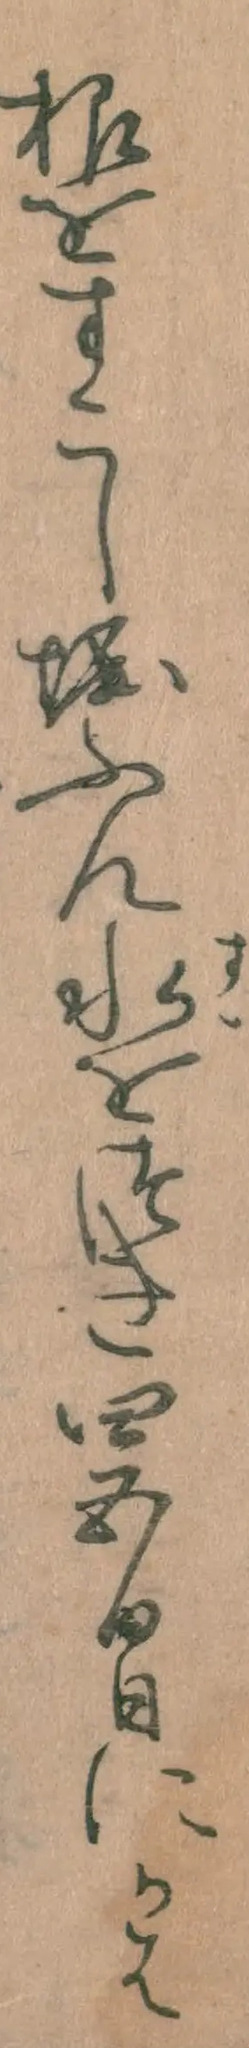根をすこし堀ふん水をつき四五日目にかは
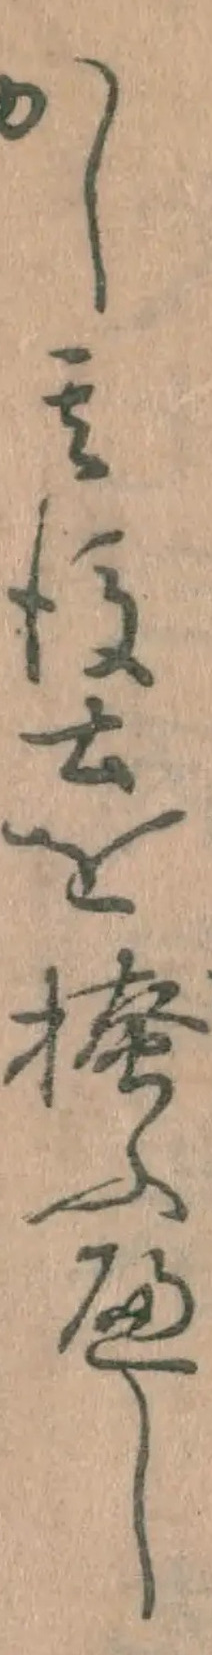かし其後土を掩ふへし
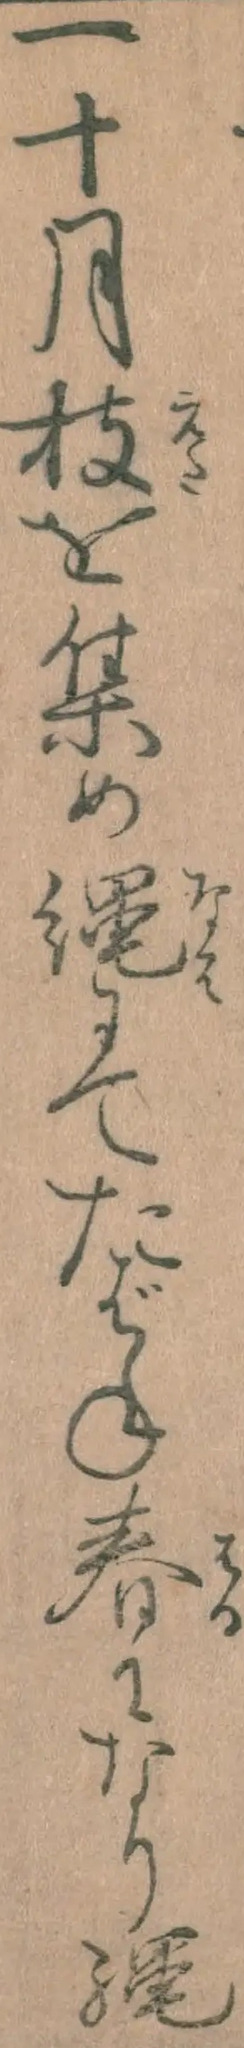一十月枝を集め縄にてたばね春になり縄
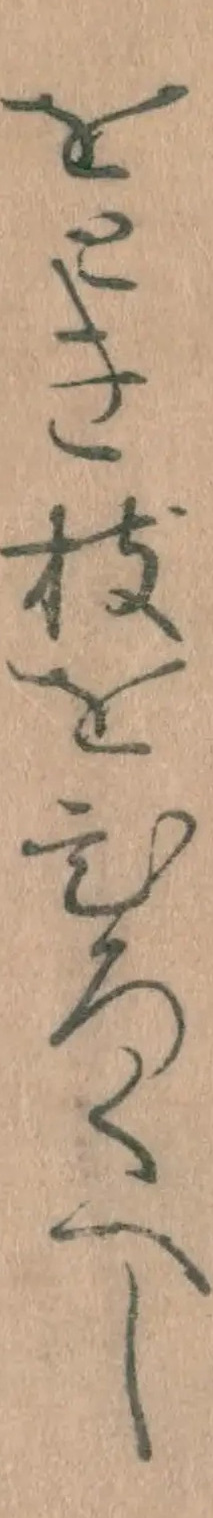をとき枝をひろくへし

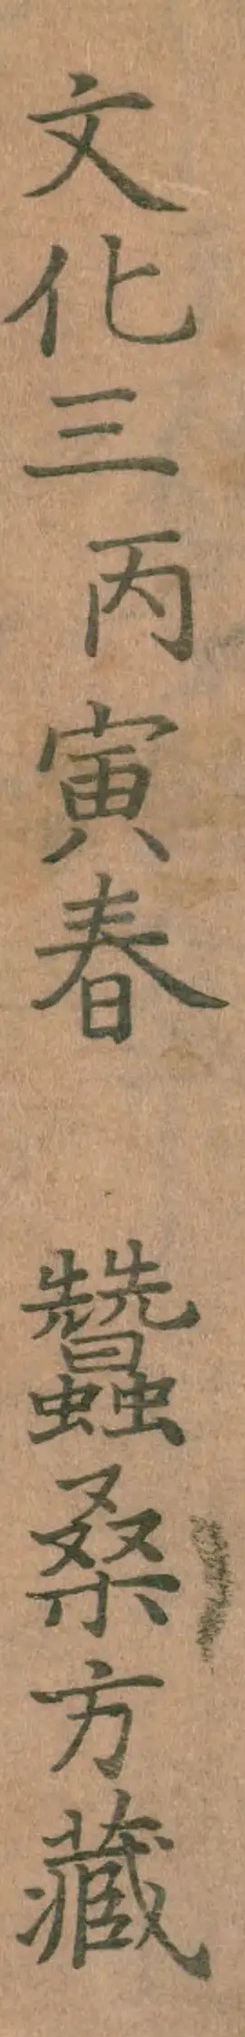文化三丙寅春蚕桑方蔵
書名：養蚕手引
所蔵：国立国会図書館 National Diet Library, JAPAN
